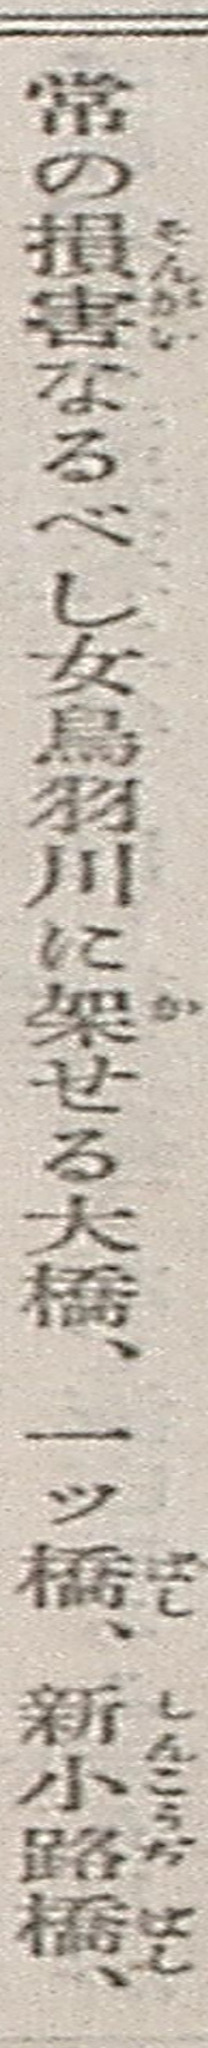常の損害なるべし女鳥羽川に架せる大橋、一ッ橋、新小路橋、
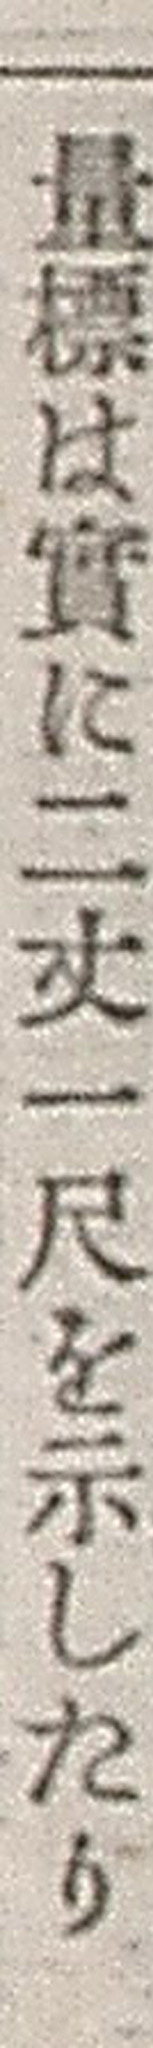量標は実に二丈一尺を示したり
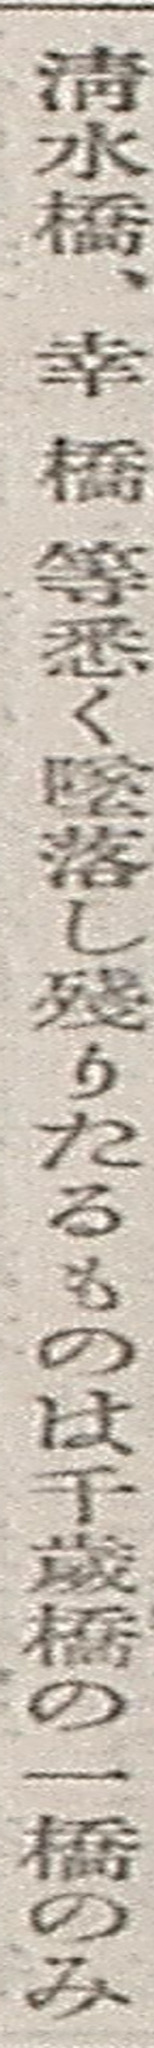清水橋、幸橋等悉く墜落し残りたるものは千歳橋の一橋のみ
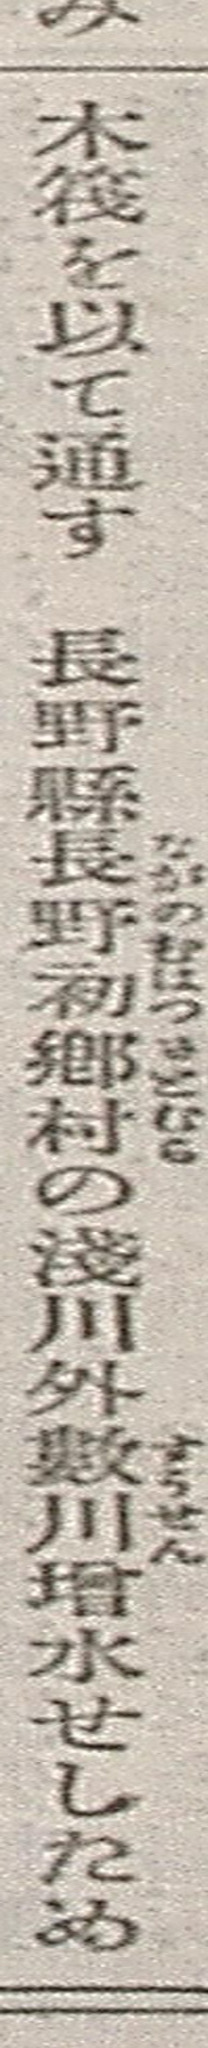木筏を以て通ず長野県長野初郷村の浅川外数川増水せしため
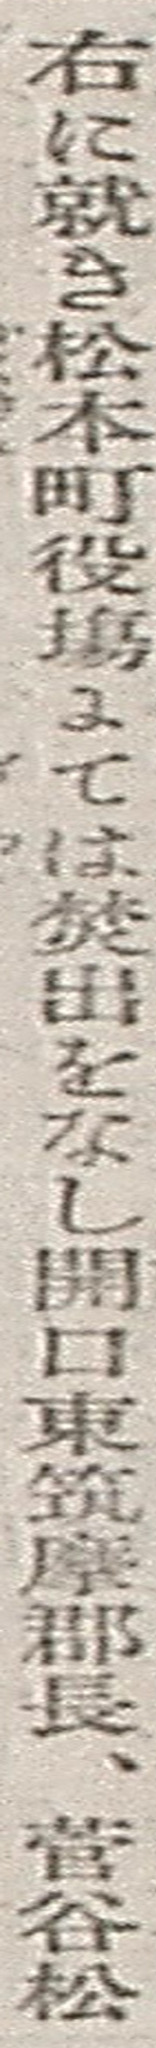右に就き松本町役場にては焚出をなし開口東筑摩郡長、菅谷松
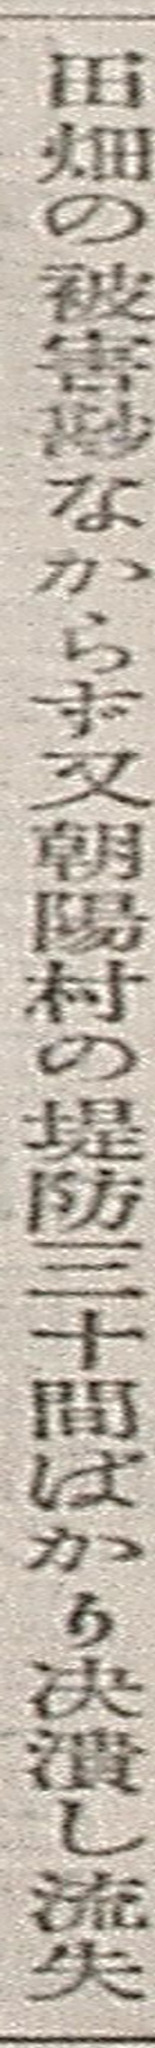田畑の被害尠なからず又朝陽村の堤防三十間ばかり決潰し流失
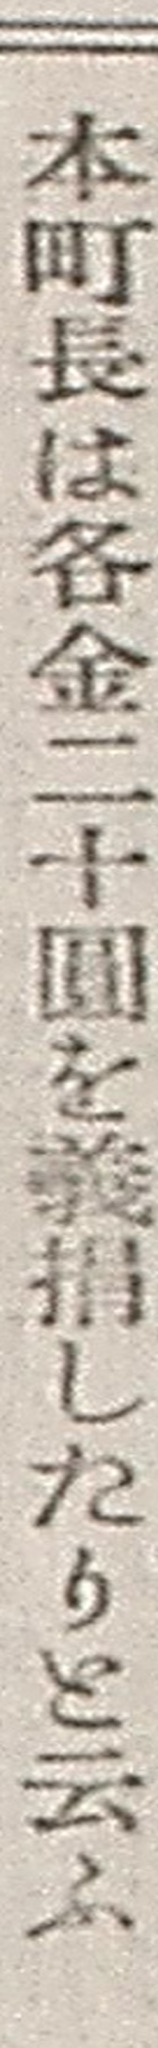本町長は各金二十円義捐したりと云ふ
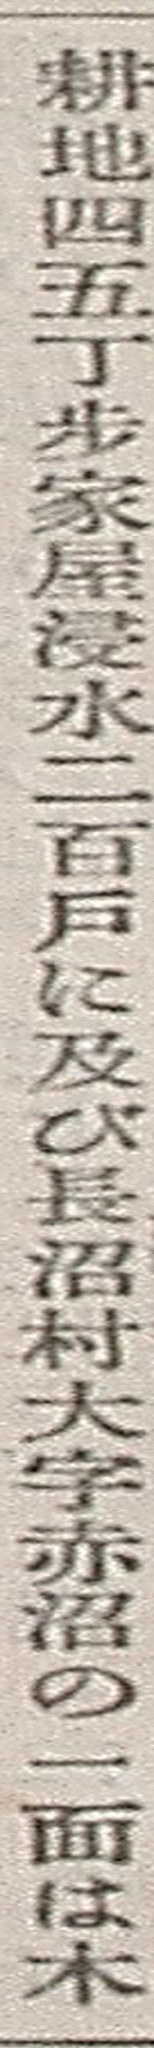耕地四五町歩家屋浸水二百戸に及び長沼村大字赤沼の一面は木
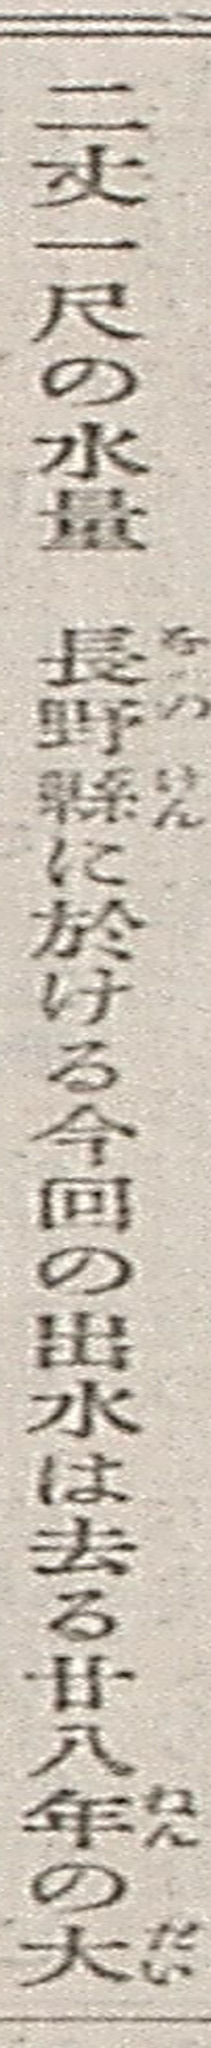二丈一尺の水量、長野県に於ける今回の出水は去る廿八年の大
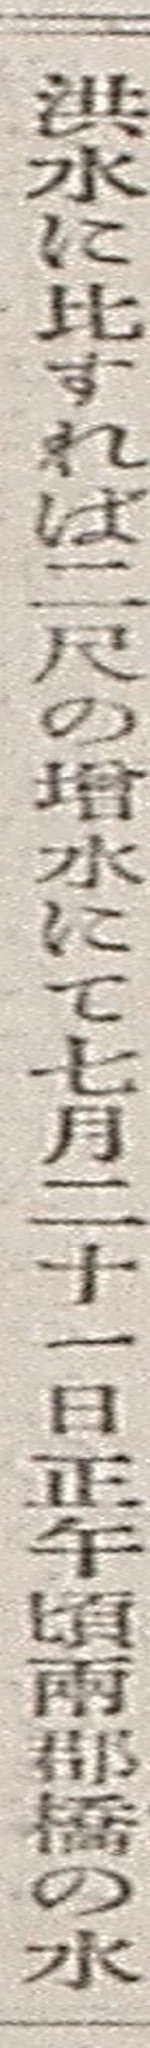洪水に比すれば二尺の増水にて七月二十一日正午頃両郡橋の水

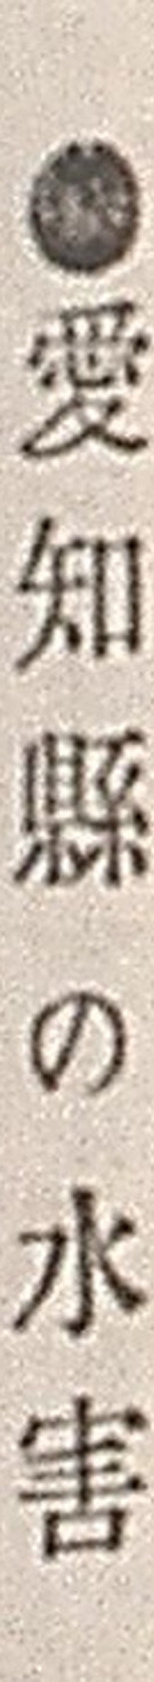●愛知県の水害
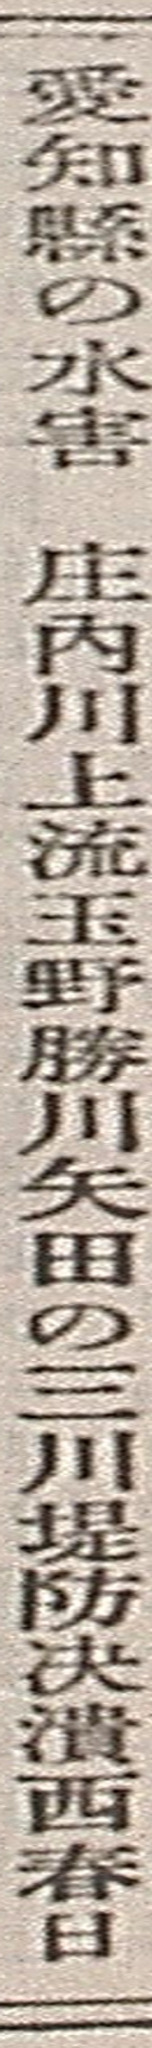愛知県の水害庄内川上流玉野勝川矢田の三川堤防决潰西春日
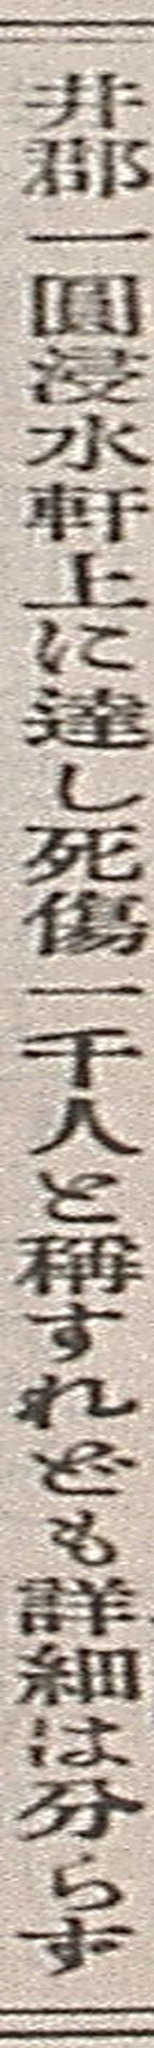井郡一円浸水軒上に達し死傷一千人と称すれども詳細は分らず
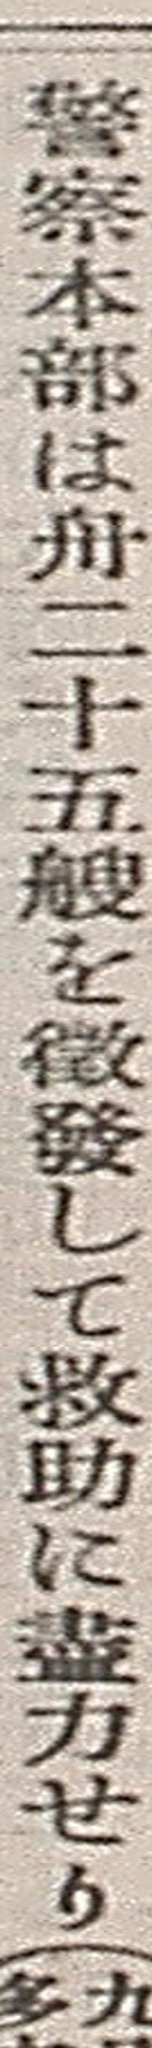警察本部は舟二十五艘を徴発して救助に尽力せり
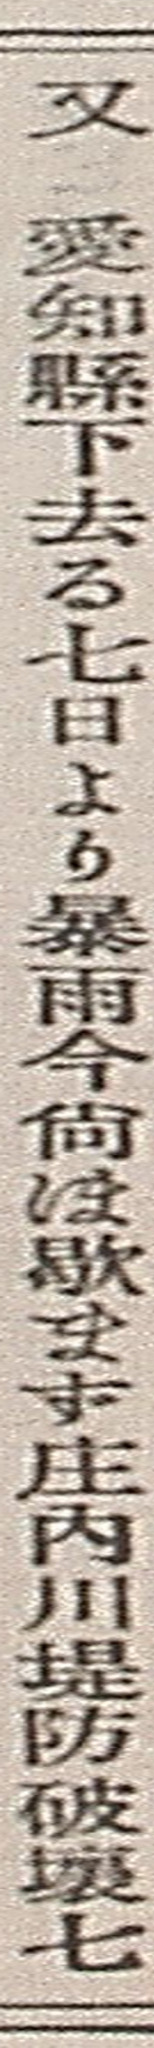又愛知県下去る七日より暴雨今尚ほ歇まず庄内川堤防破壊七
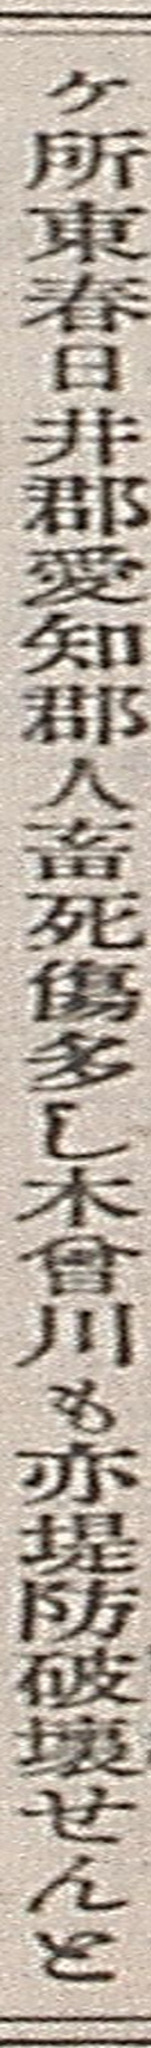ヶ所東春日井郡愛知郡人畜死傷多し木曽川も亦堤防破壊せんと
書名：風俗畫報臨時増刊第百二十六號　洪水被害録（中）
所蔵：東京大学地震研究所図書室 Earthquake Research Institute Library, The University of Tokyo, JAPAN
